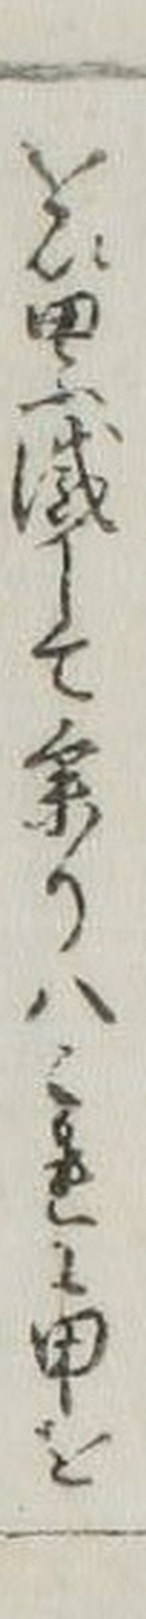を以累減して余り八これに甲を
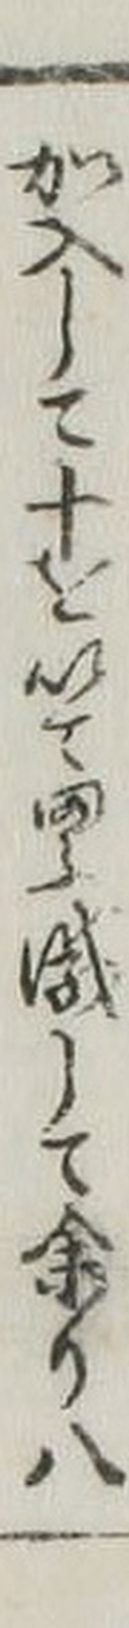加入して十を以て累減して余り八
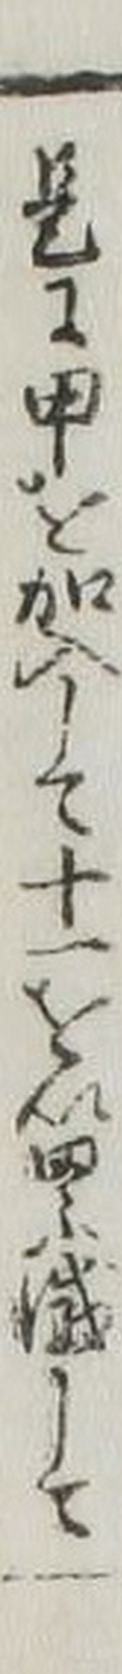是に甲を加入して十一を以累減して
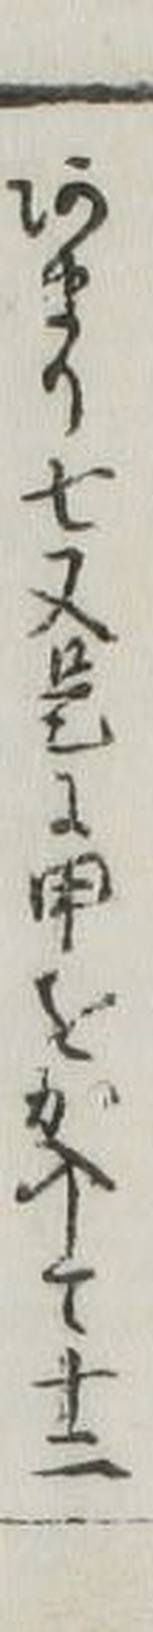あまり七又是に甲を加入して十二
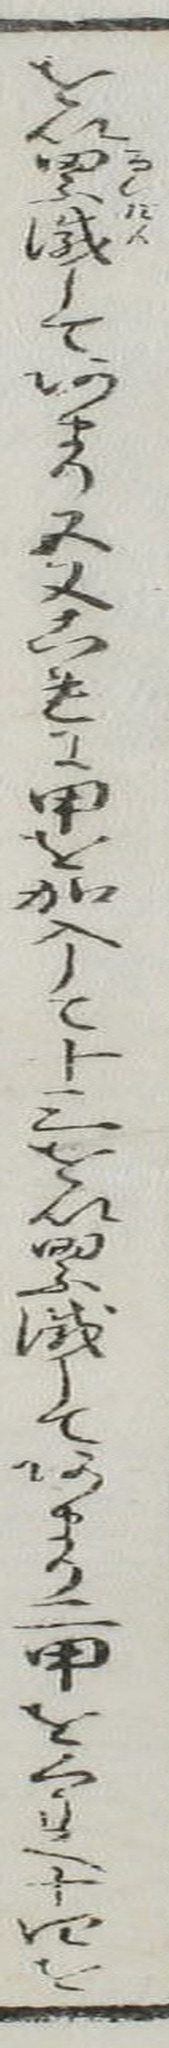を以累減してあまり五又これに甲を加入して十三を以累減してあまり二甲をくわへ十四を
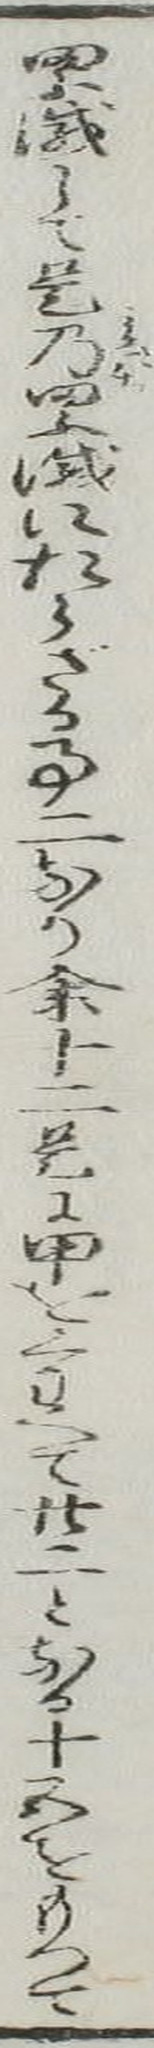累減して是乃累減にたらざる事二なり余十二是に甲をくわへて廿二となる十五をもつて
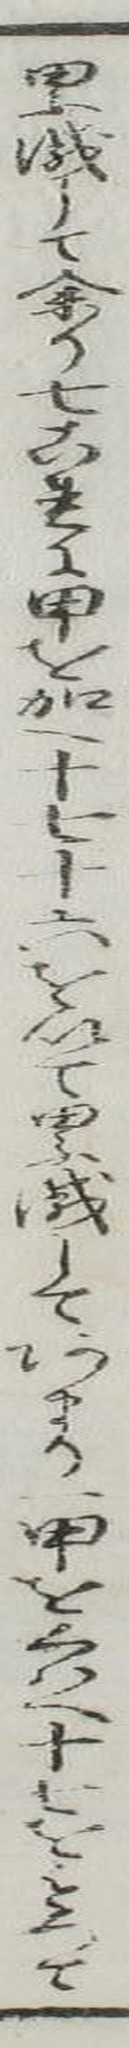累減して余り七これに甲を加へ十七十六を以て累減してあまり一甲をくはへ十七をもつて
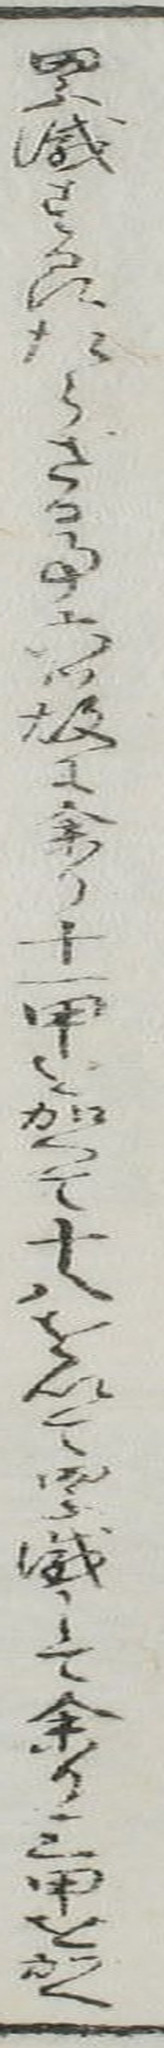累減するにたらざる事六ツ故に余り十一甲を加へて十八を以て累減して余り三甲を加へ
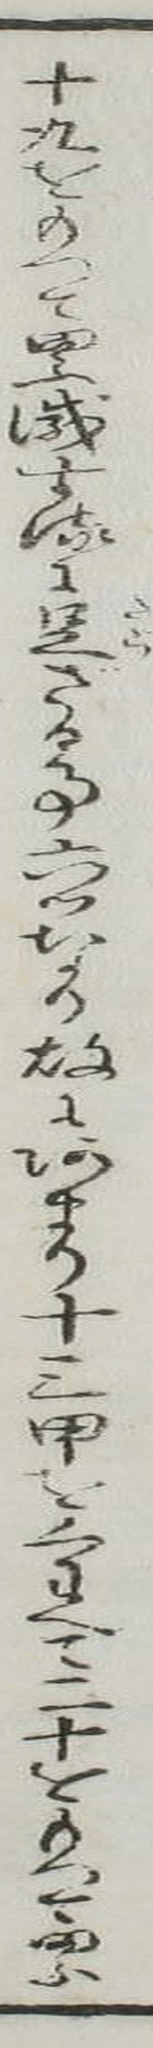十九をもつて累減するに足ざる事六ツなり故にあまり十三甲をくわへて二十をもつて累
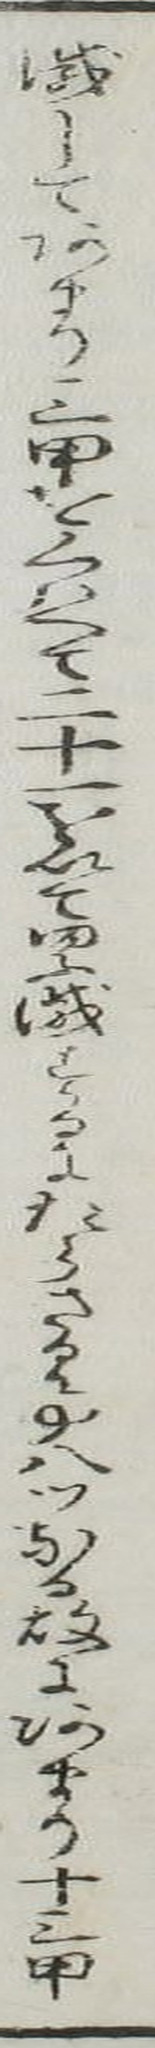減してあまり三甲をくはへて二十一を以て累減するにたらさる事八ツなる故にあまり十三甲
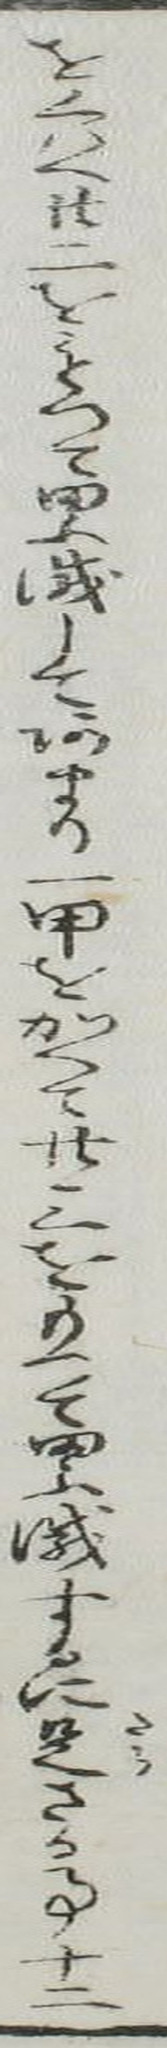をくはへ廿二をもつて累減してあまり一甲を加へて廿三をもつて累減するに足さる事十二
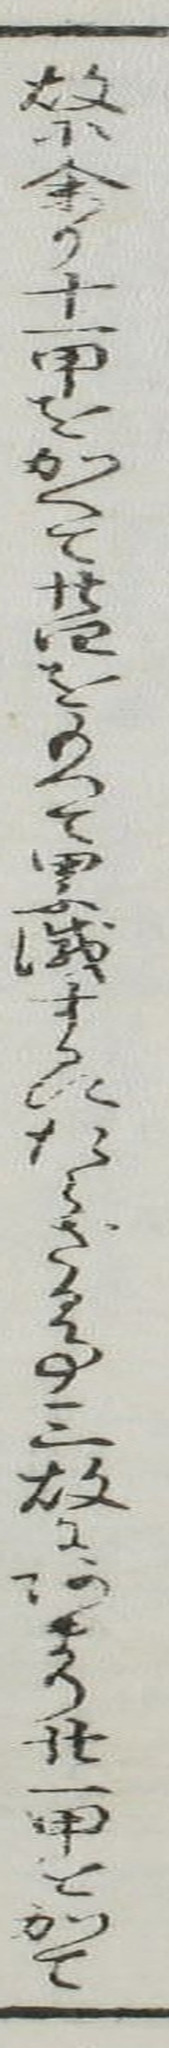故に余り十一甲を加へて廿四をもつて累減するにたらざる事三故にあまり廿一甲を加て
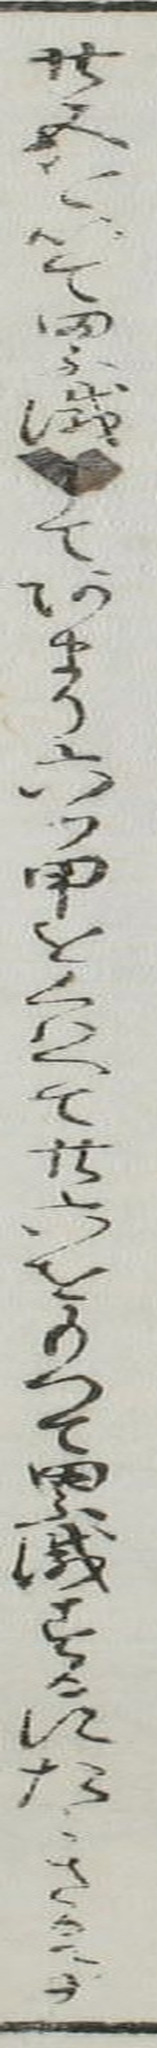廿五を以て累減してあまり六ツ甲をくはへて廿六をもつて累減するにたらさる事
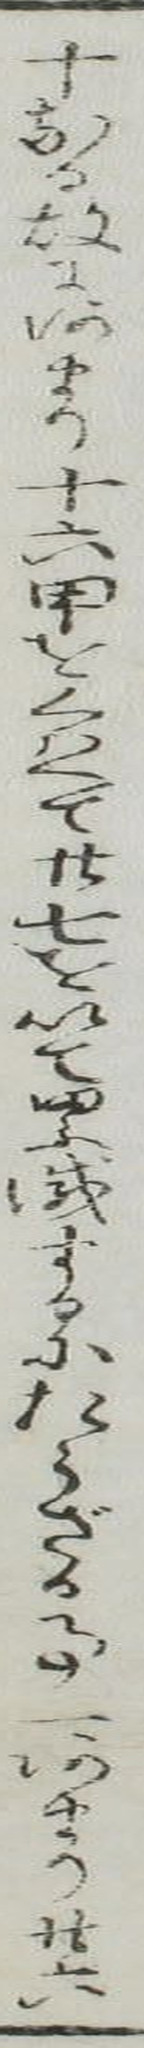十なる故にあまり十六甲をくはへて廿七を以て累減するにたらざる事一あまり廿六
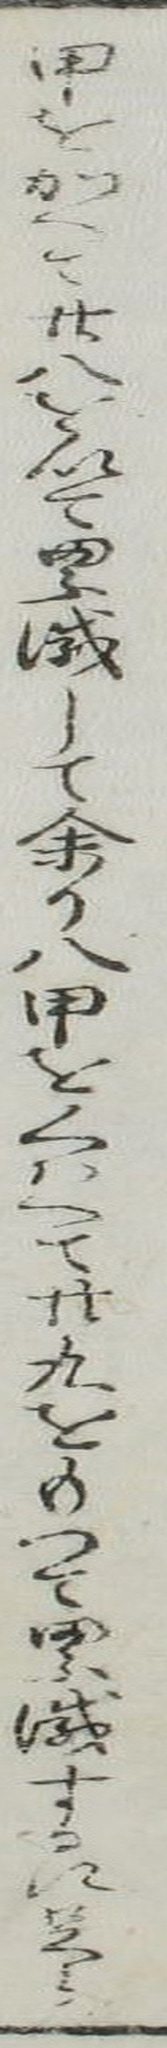甲を加へて廿八を以て累減して余り八甲をくはへて廿九をもつて累減するに足ら
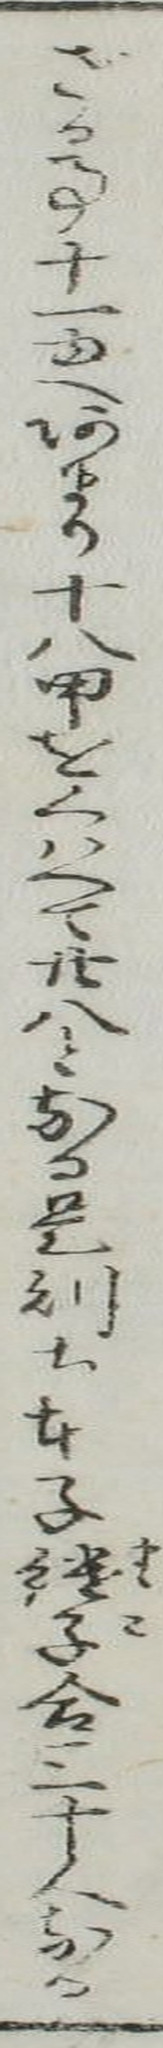ざる事十一ゆへあまり十八甲をくはへて廿八となる是則ち本子継子合三十人なる
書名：宝玉塵劫記
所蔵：東京学芸大学教育コンテンツアーカイブ
